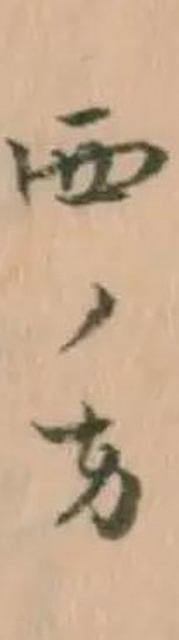東ノ方
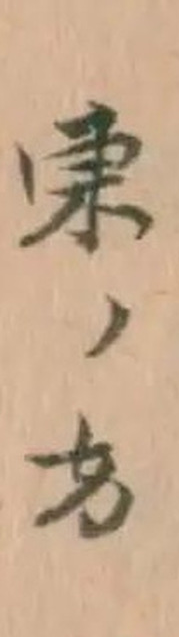東ノ方
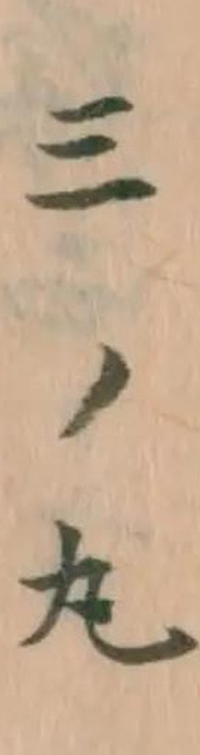三之丸
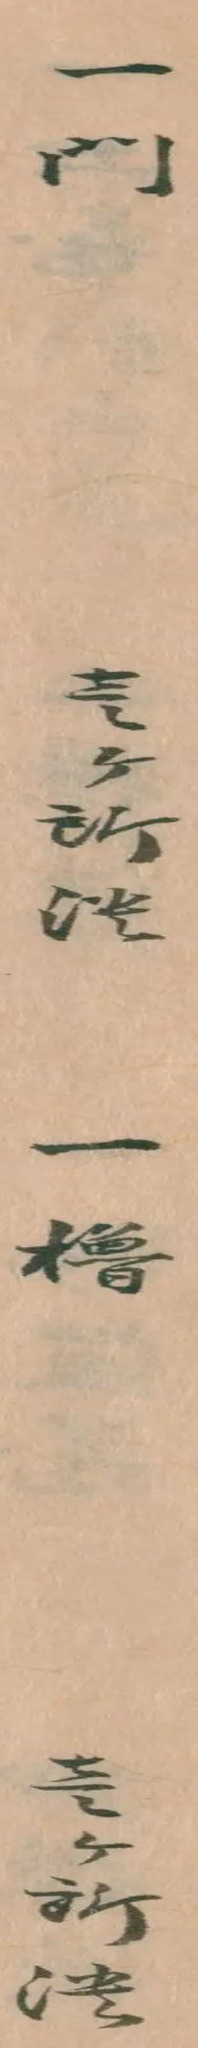一門壱ヶ所潰一櫓壱ヶ所潰
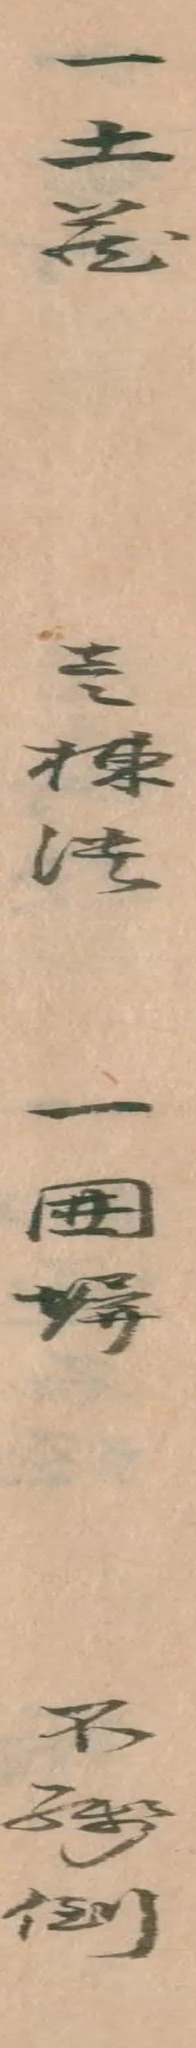一土蔵壱棟潰一囲塀不残倒
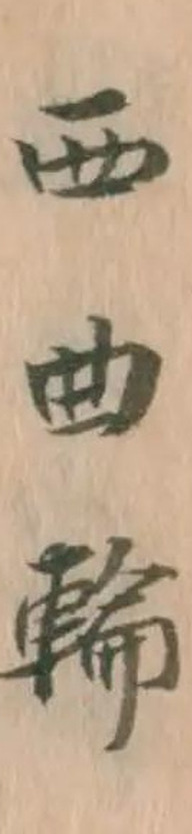西曲輪
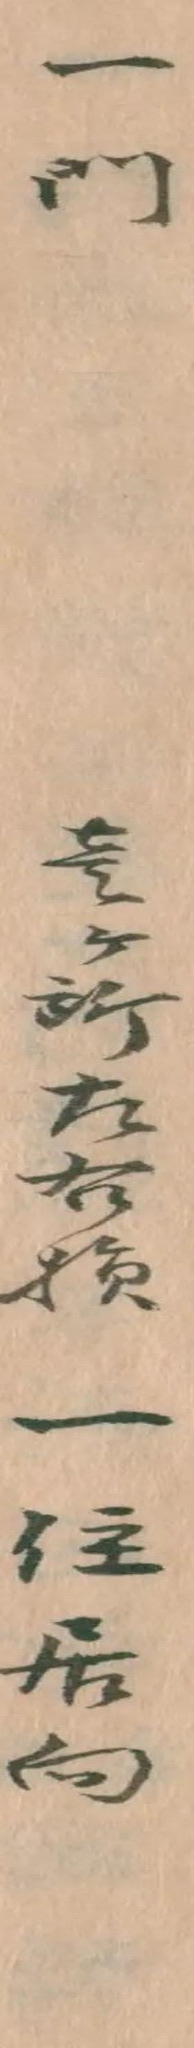一門壱ヶ所左右損一住居向半潰

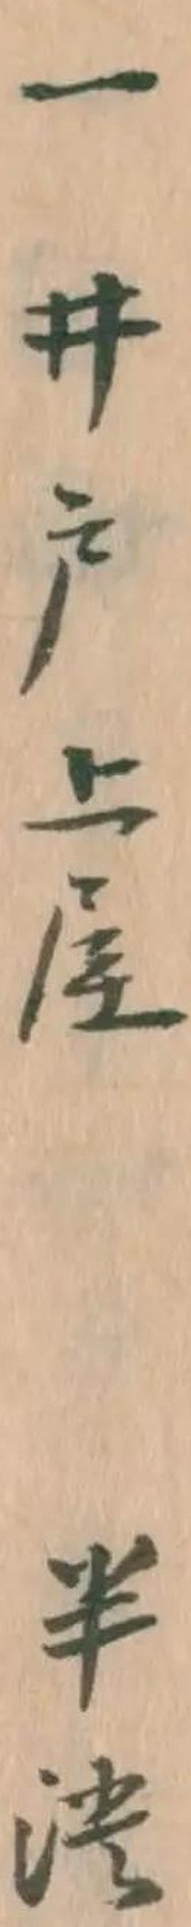一井戸上屋半潰
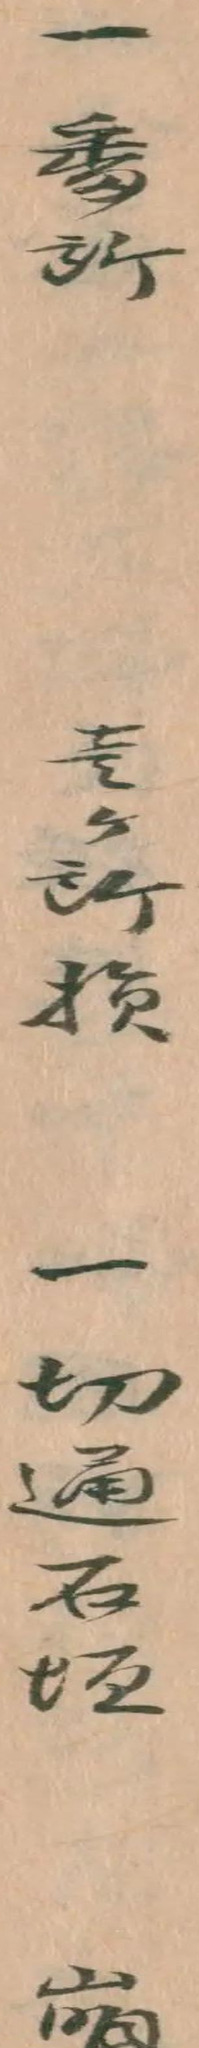一番所壱ヶ所損一切通石垣崩
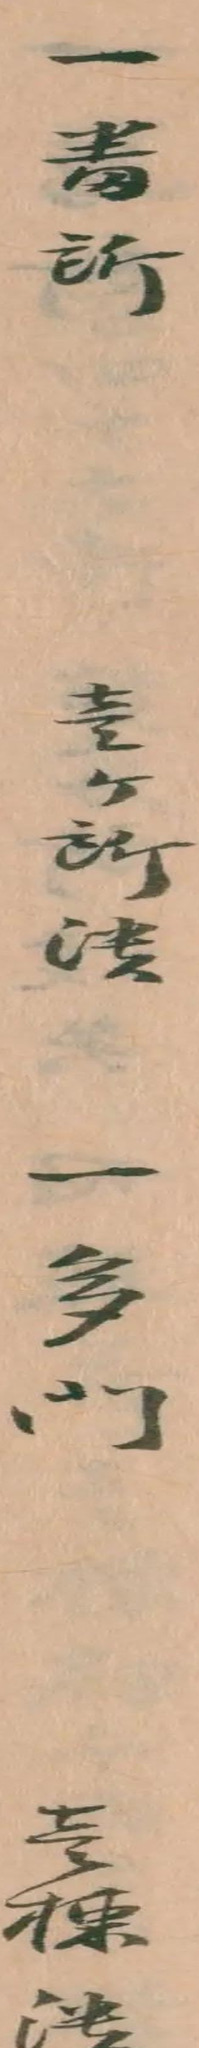一番所壱ヶ所潰一多門壱ヶ所潰
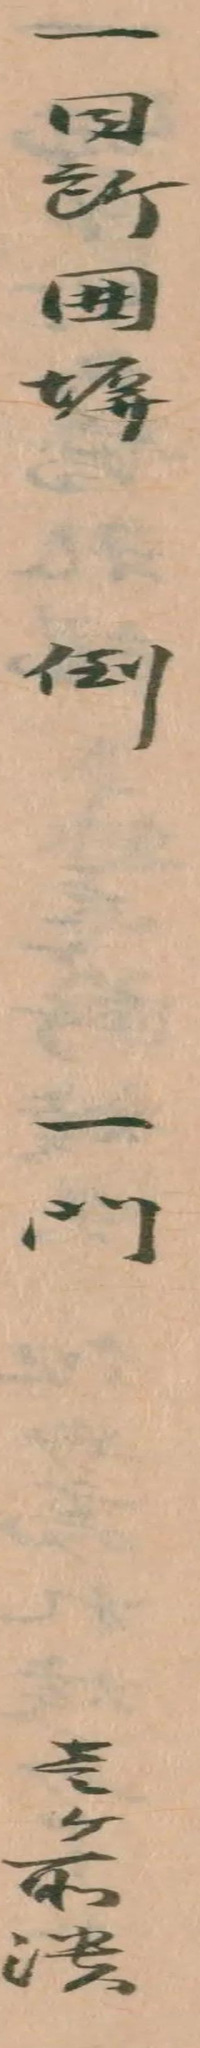一同所囲塀倒一門壱ヶ所潰
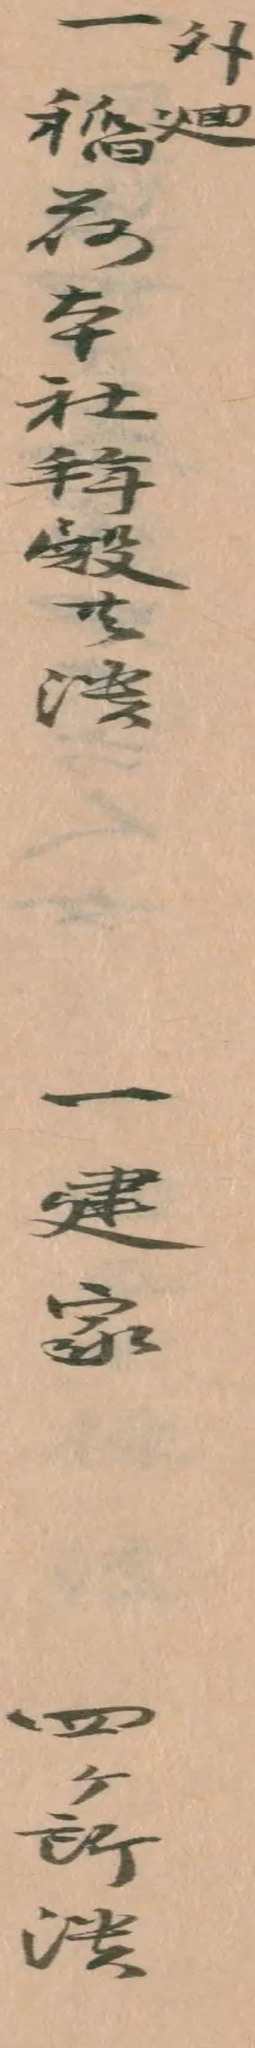一稲荷本社拝殿共潰一建家四ヶ所潰
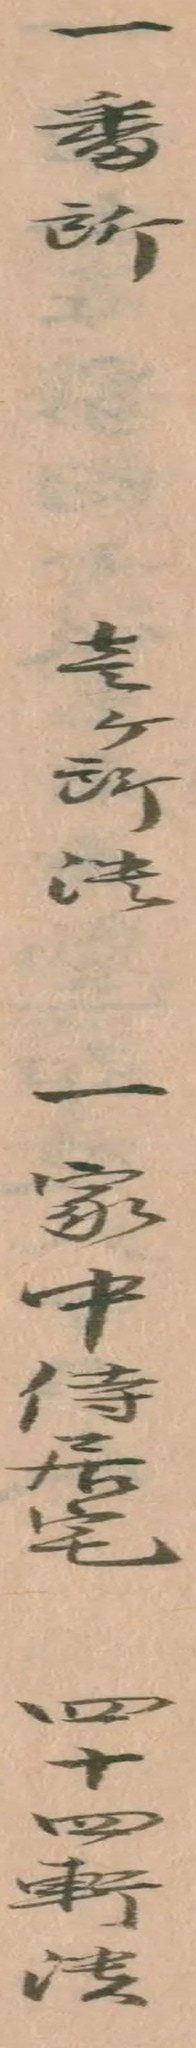一番所壱ヶ所潰一家中侍居宅四十四軒潰
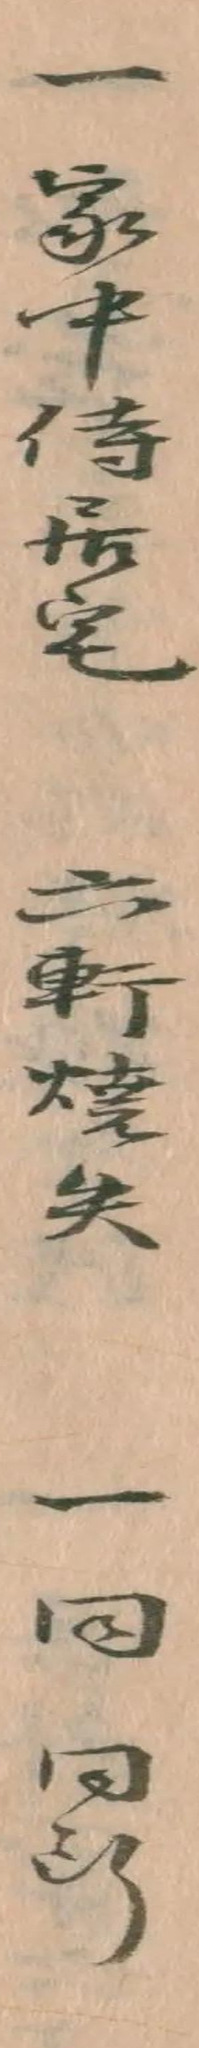一家中侍居宅六軒焼失一同同断損
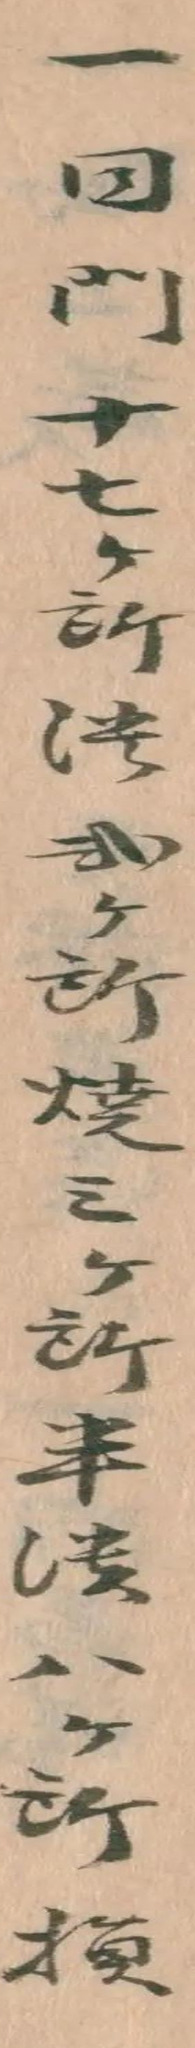一同門十七ヶ所潰弐ケ所焼三ヶ所半潰八ヶ所損
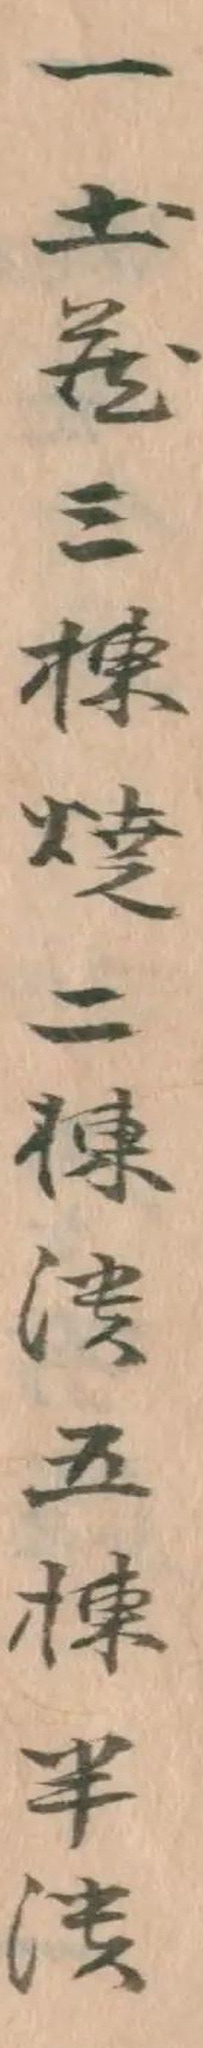一土蔵三棟焼二棟潰五棟半潰
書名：地災撮要. 巻3(地震之部)-巻4(噴火之部)
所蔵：国立国会図書館 National Diet Library, JAPAN
